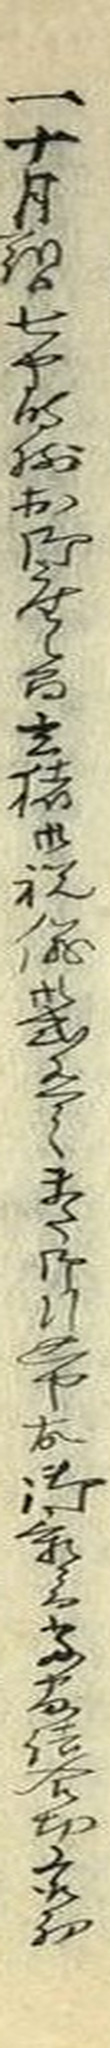一十月朔日七半時揃於御座之間玄猪御祝儀御式有之未た於引込中故御頼ニ而当番詰合切最初
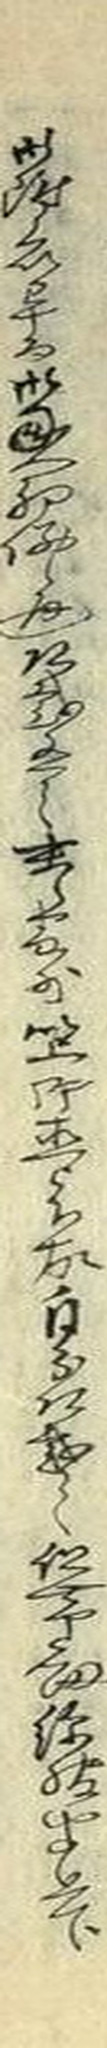御附衆畢而御用人初例之通頂戴有之末之番外以上御直被下故自分頂戴之但帯剣紋服半上下
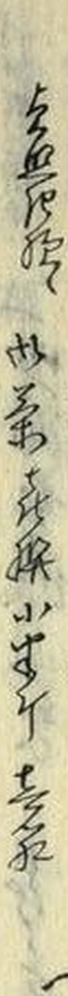貞照院様へ御茶喜撰小半斤壱箱
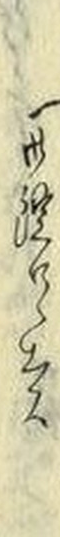御錠口へ出ス
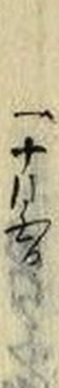一十月三日
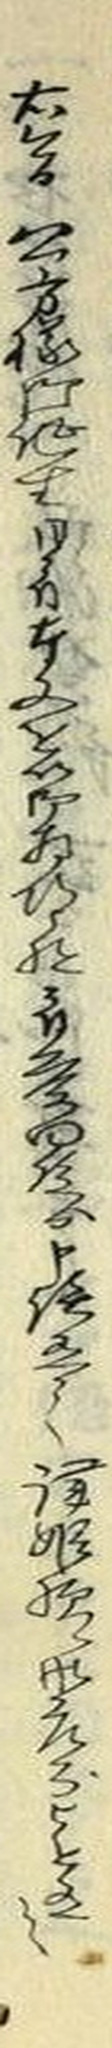右今日公方様御誕生日ニ付奉文を以御拝領被遊ニ付藤田殿ゟ申談有之謹姫様へ御取分被進有之
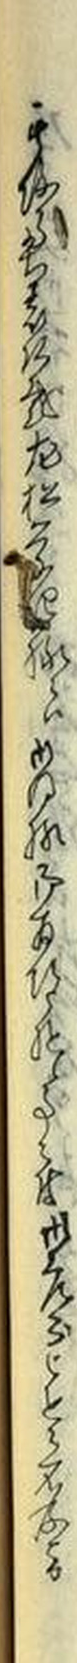其余奥表頂戴尤松栄院様ニハ御同様御拝領被遊候事ニ付御取分被進ニ不及旨
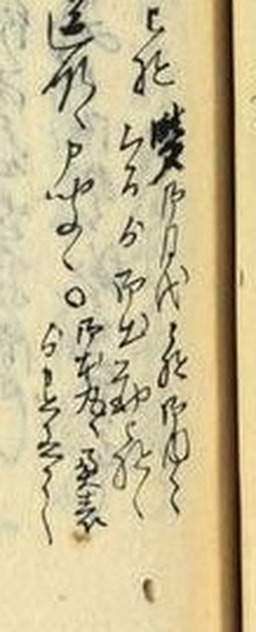今日ゟ御出勤被遊候
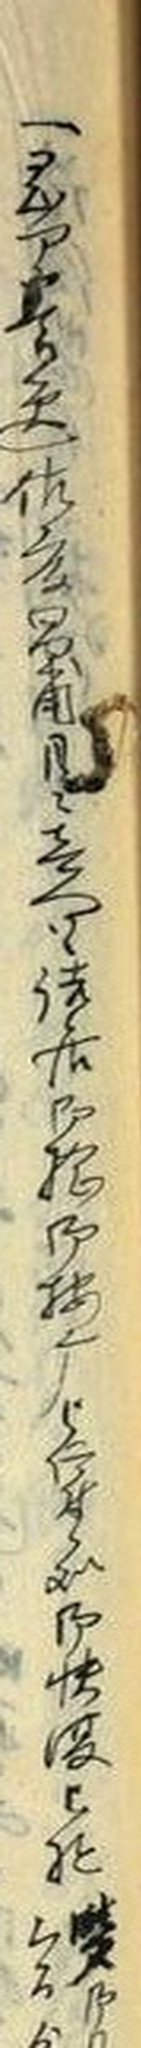一岡部養逸佐藤易甫日々壱人ツヽ詰居御捻御按摩被仰付候処御快復被遊
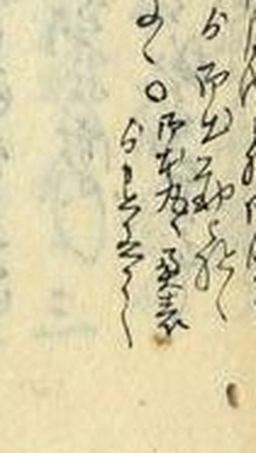ゟ申上有之
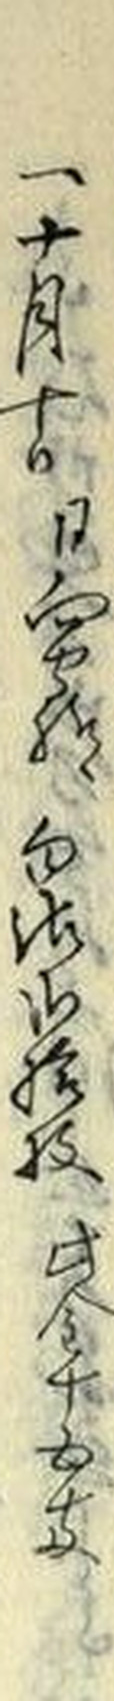一十月十日日向守様へ白銀弐拾枚此金十五両
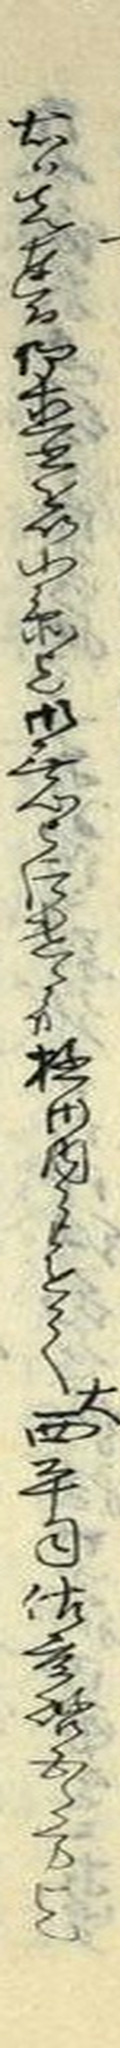右ハ先達而御直書を以小兵衛迄御無心被仰遣候ニ付極御内々被進之大西平司佐藤啓五郎方迄
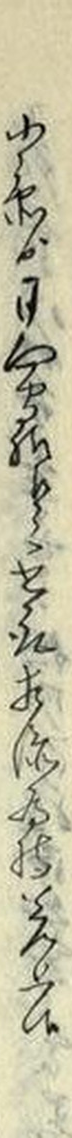小兵衛ゟ日向守様江之書取相添為持差上候
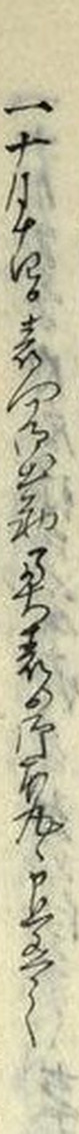一十月十四日表向出勤奥表ゟ御本丸へ申上有之
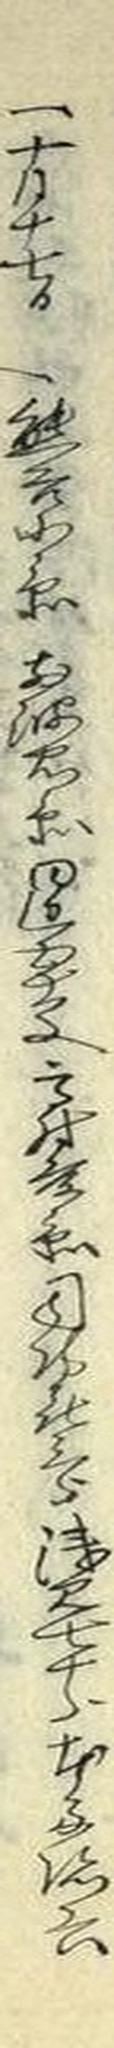熊谷小兵衛前波忠兵衛田辺五太夫高村藤兵衛周防喜三郎浅見七十郎本多弥六
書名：少傅日録抄（斉善付側向頭取日記、在府）
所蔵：福井県文書館 Fukui Prefectural Archives
